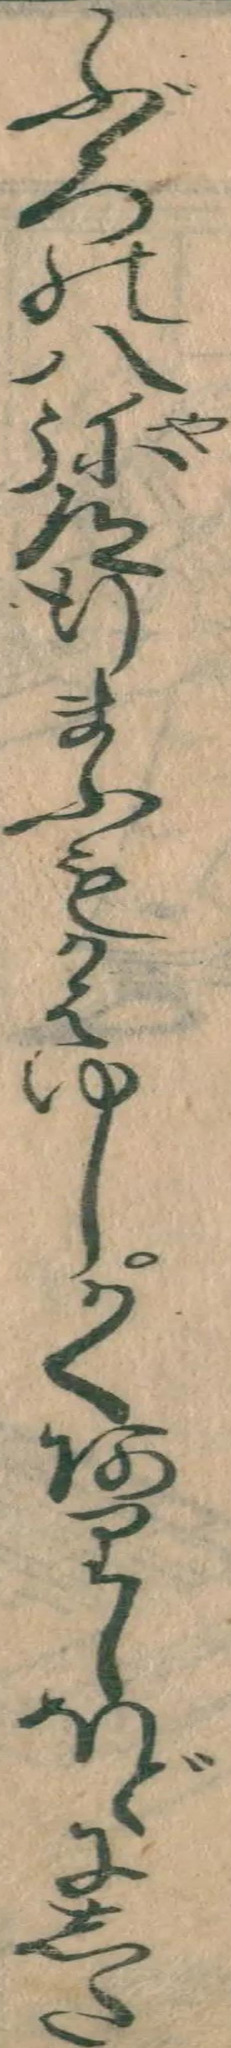かぶろの八弥道行まふもかはゆし。かくありしほどにした
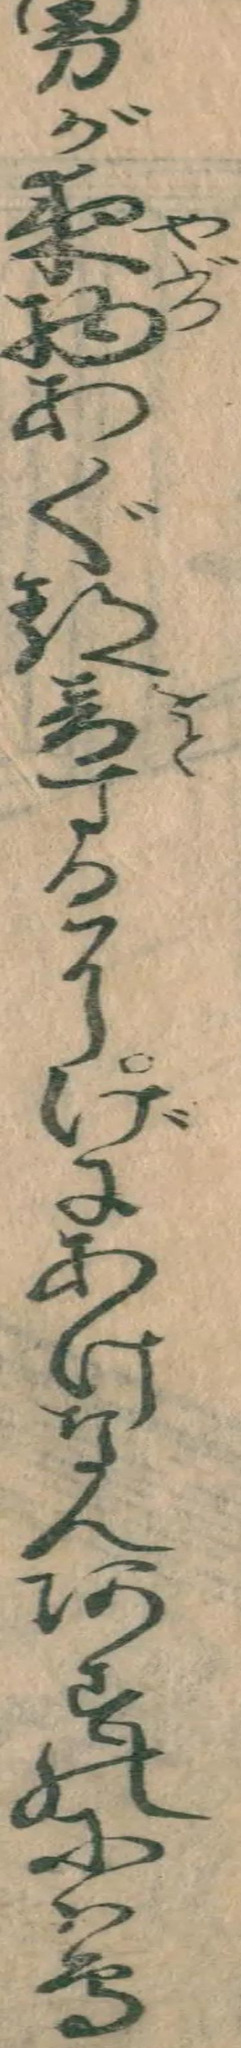男が夜物あぐる音するに。げにあけなんあすのには鳥
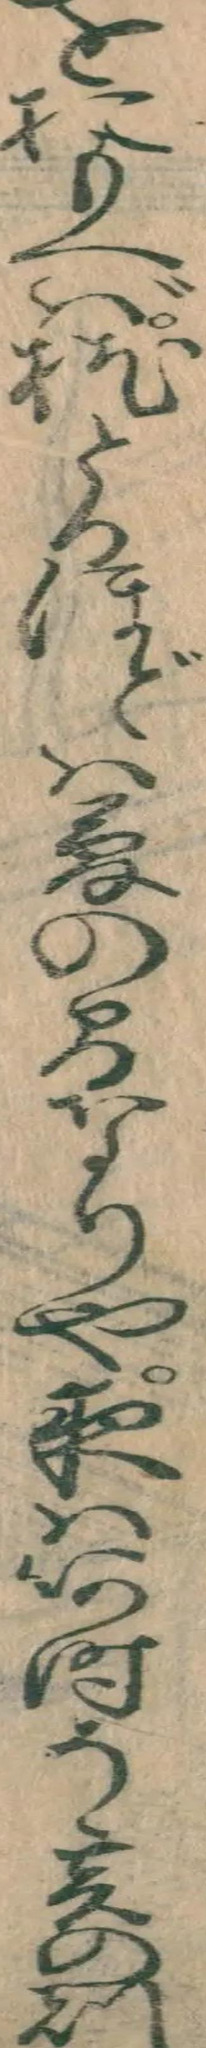をおもへば。枕とるほどは夢の間なりや。夜は何時そ亥の刻
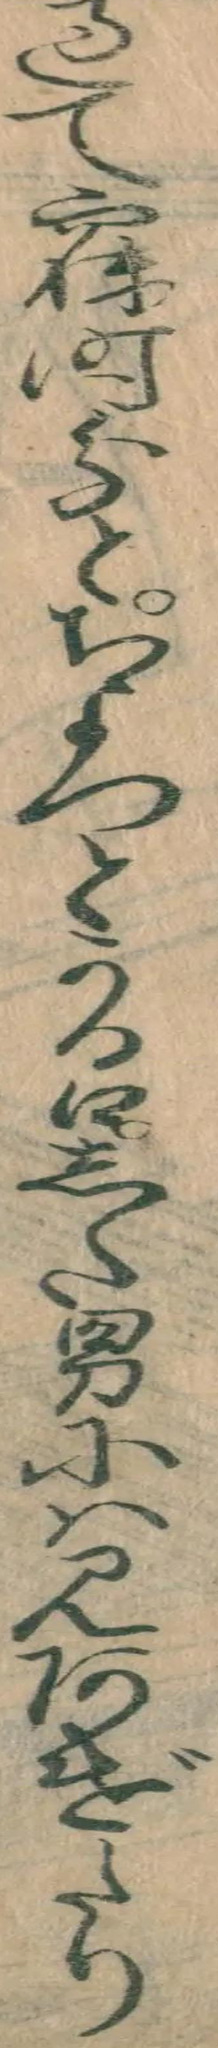過て寝時分と。ちよつとかる口。した男には見あげたり
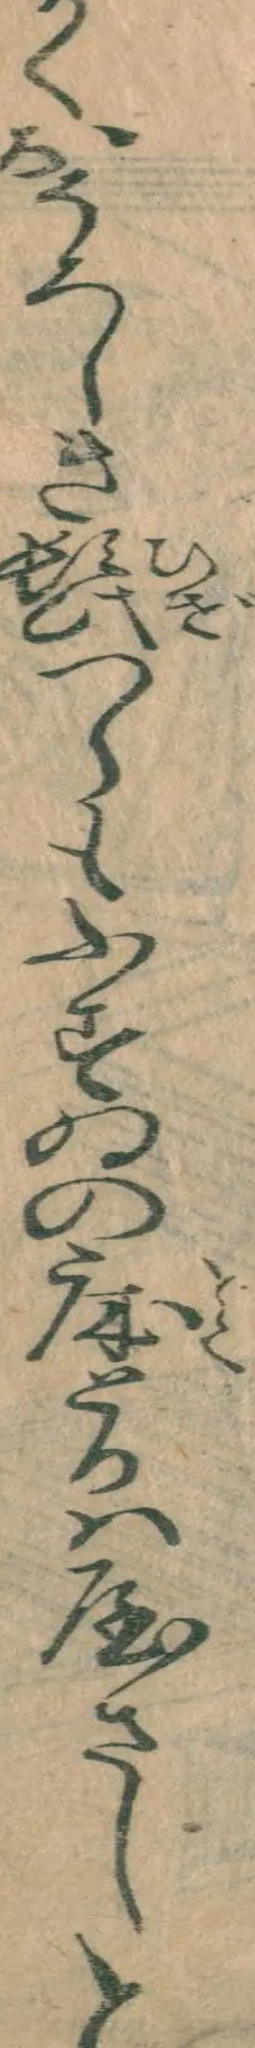かくおそろしき髭つらもふすゐの床とるはやさしと

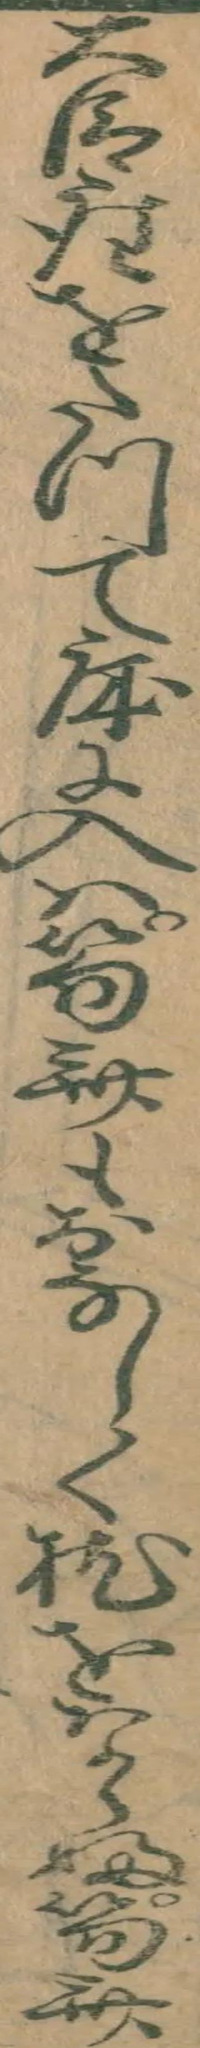大臣座をたつて床に入は。筍斎もおなしく枕をならふ。筍斎
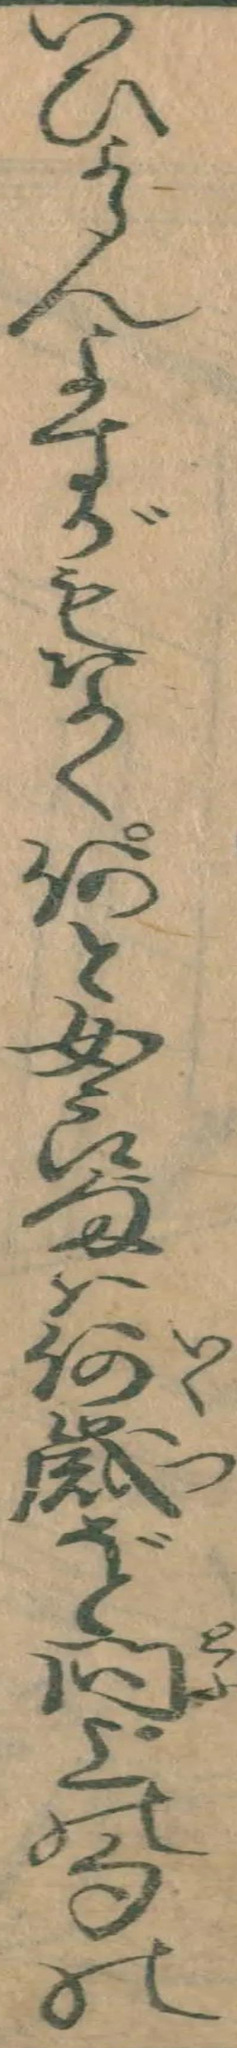いひよらんよすがもなく。何と女郎様は何歳ぞと問。上の句の
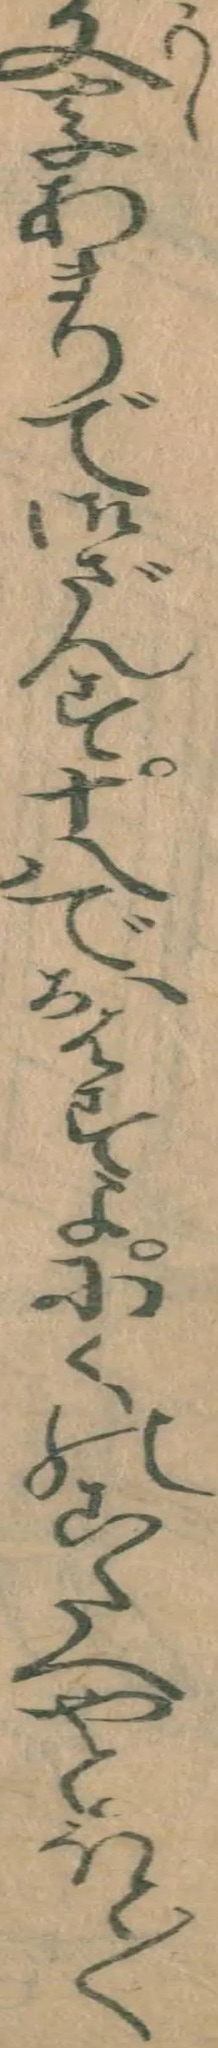文字あまりで御ざんす。十八でおはすよ。にくのこたへやとほと〳〵
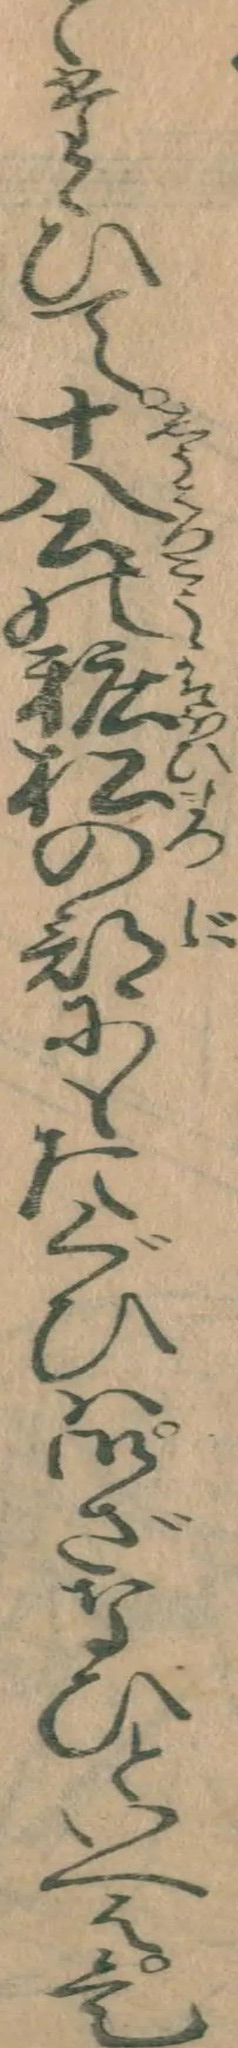とたゝひて。十八公の粧松の部にもたぐひは。御ざなひといへは。是
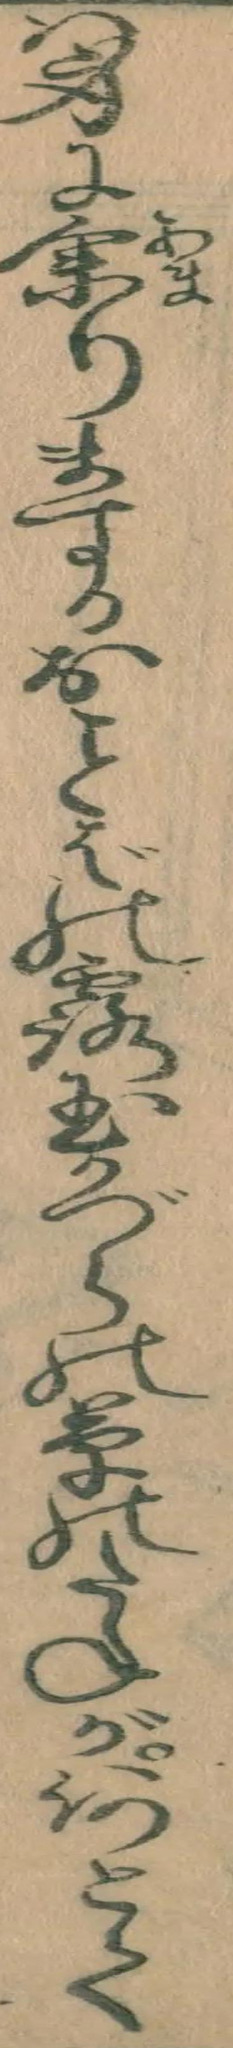は身に余りまするおことばの露玉かづらの草のたねが。何とて
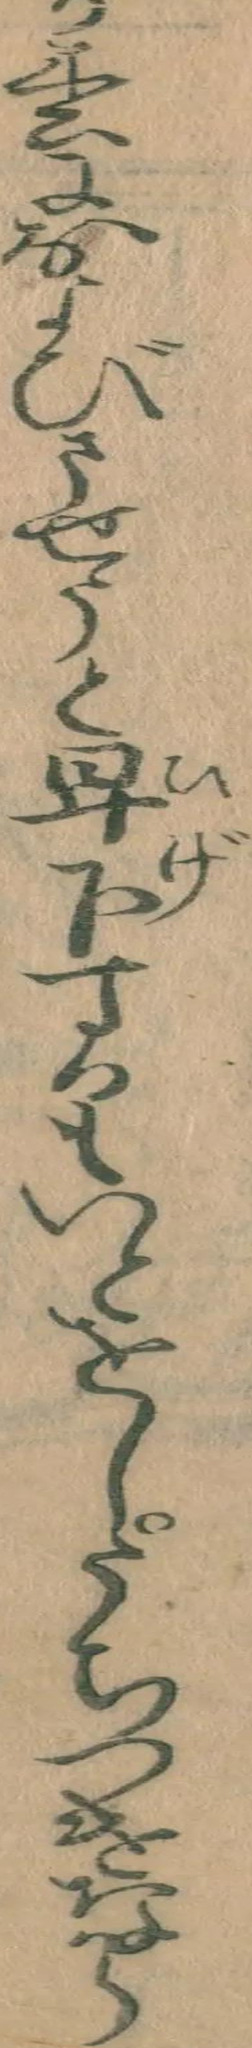か松におよびませうと卑下するもいとをし。うちつけなから
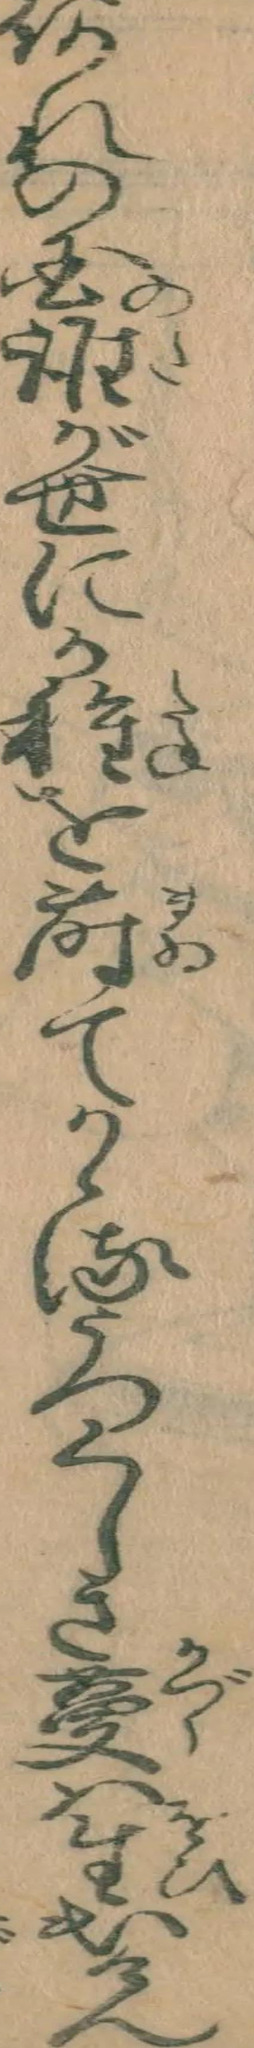何れの国の誰が世にか種を蒔てかゝるうつくしき蔓は生出けん
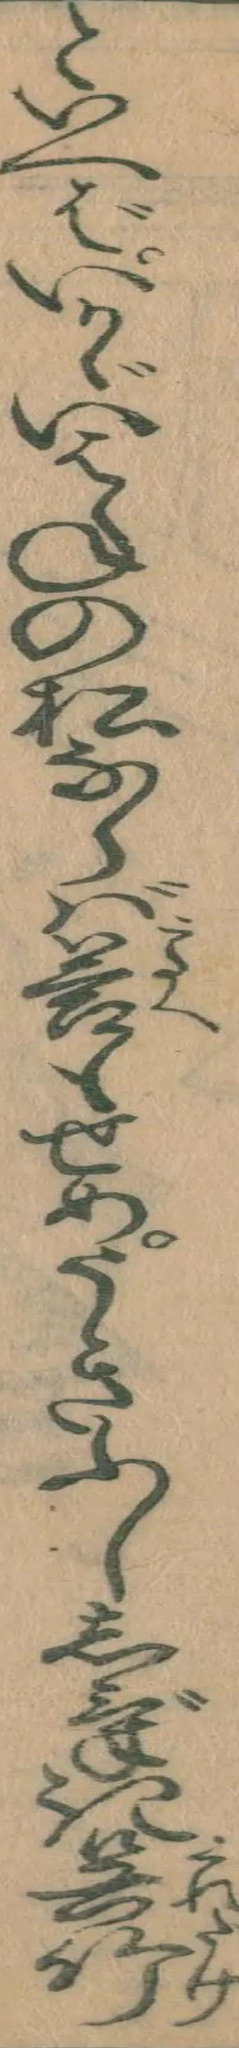といへば。いかゞははねの松ならば答もせめ。うきふししげき呉竹
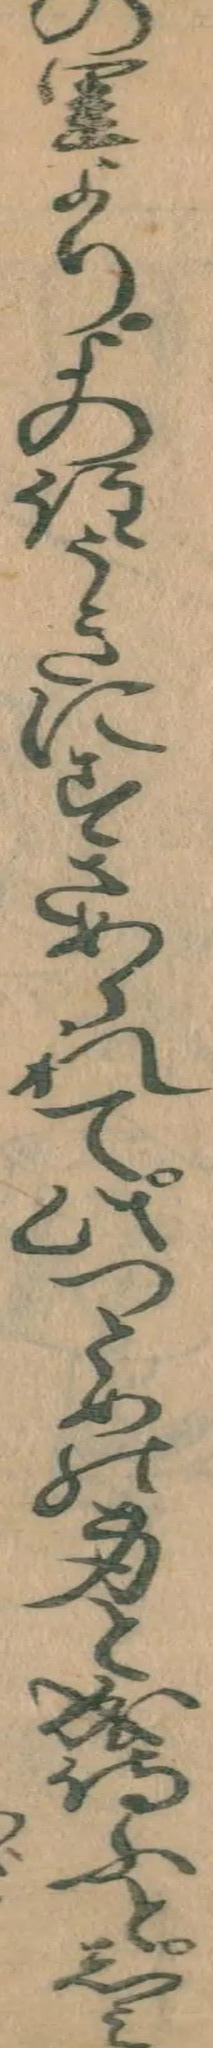の里より。よの住うきにすさめられて。此つとめの身と成侍ふと。しみ
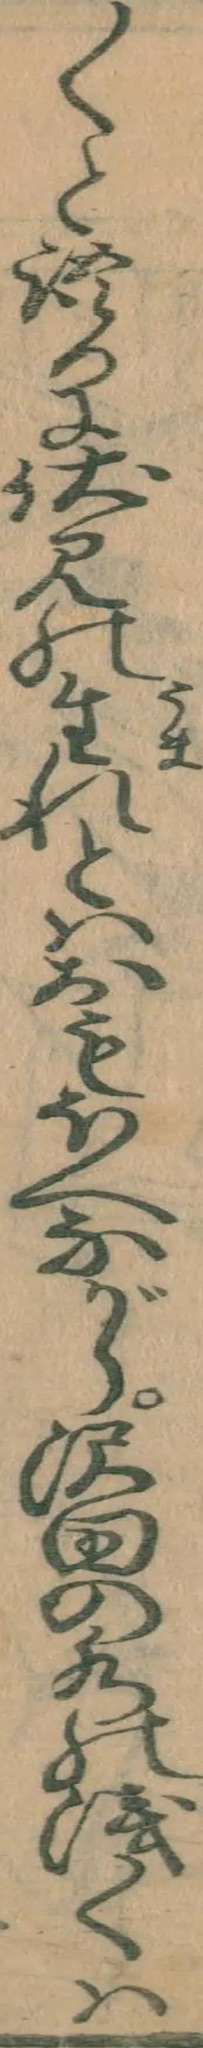〳〵と語るに伏見の生れとはおもほへながら。沢田の水の浅くは
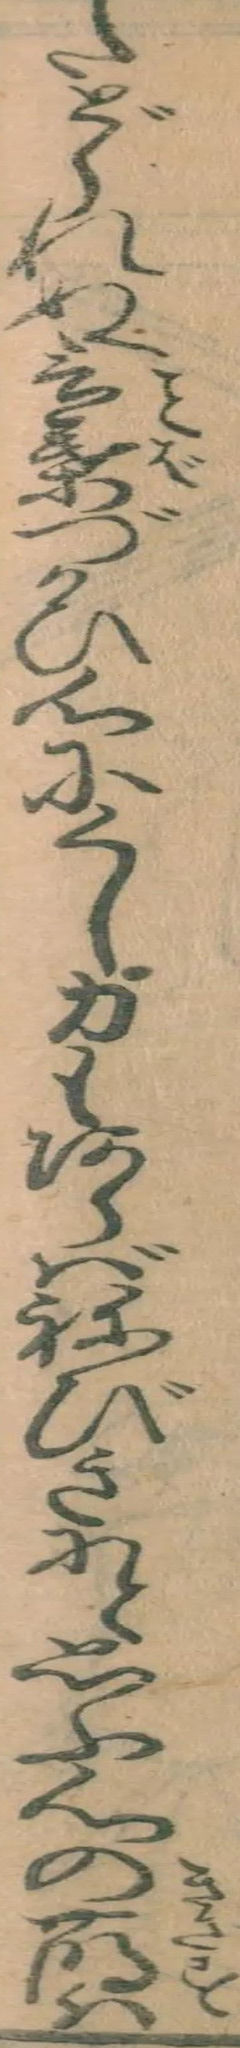たどられぬ言葉づかひ心にくし。力もあらばねびきにと思ふ心の萌は
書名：新竹斎 5巻
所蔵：国立国会図書館 National Diet Library, JAPAN
